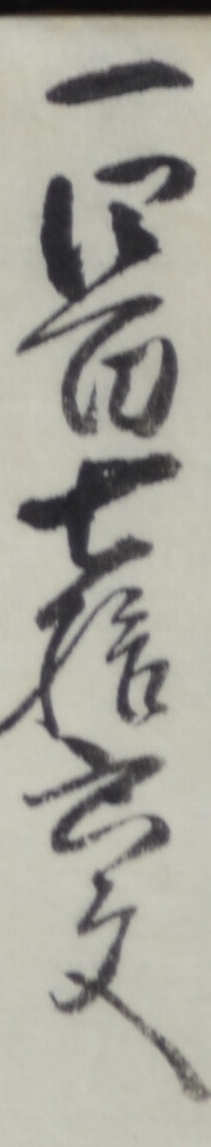一四百七拾六文
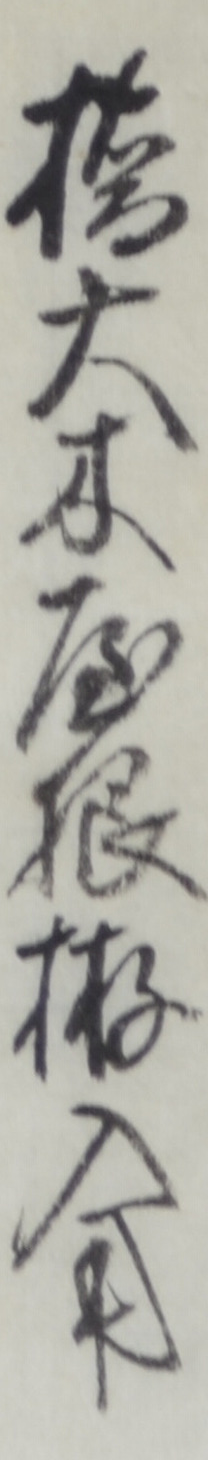橋大木屋根拵入用
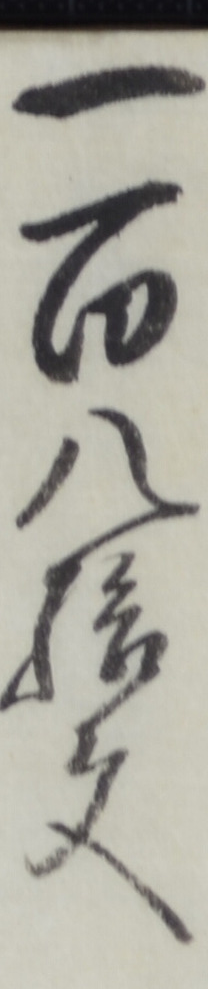一百八拾文
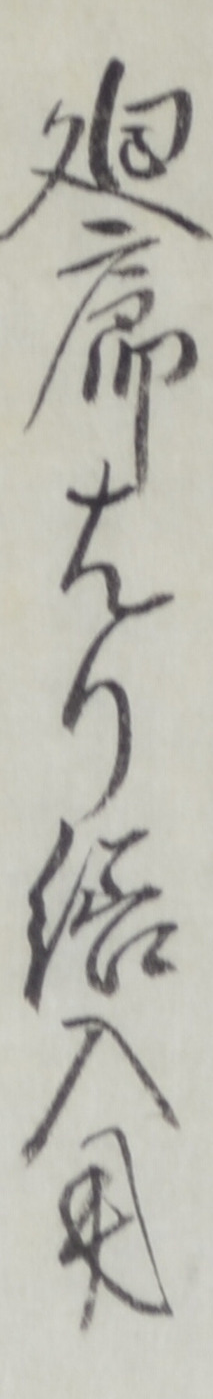廻廊はり繕入用
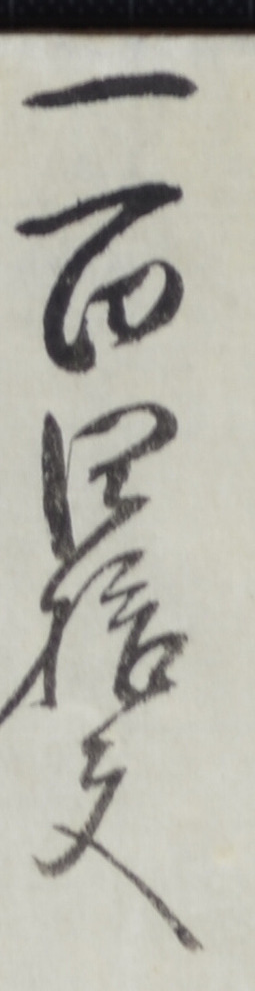一百四拾文
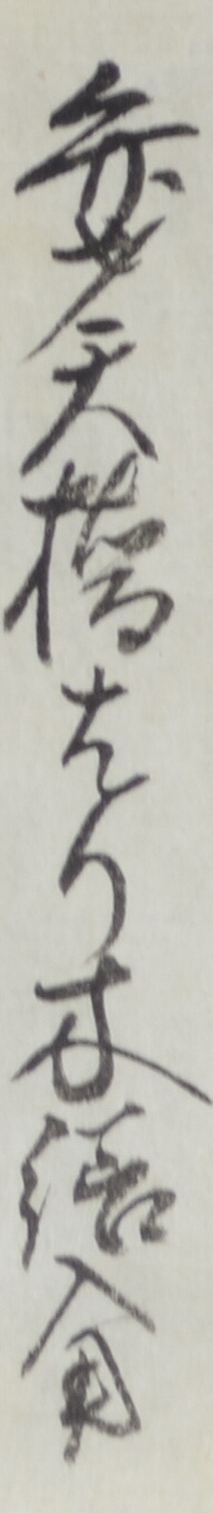弁才天橋はり木繕入用
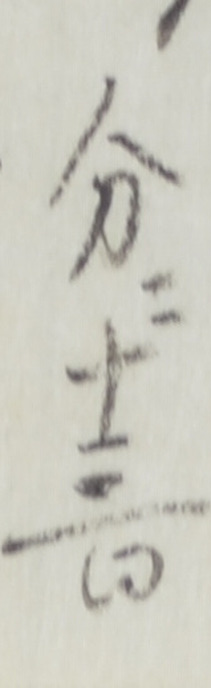分ニ十三日
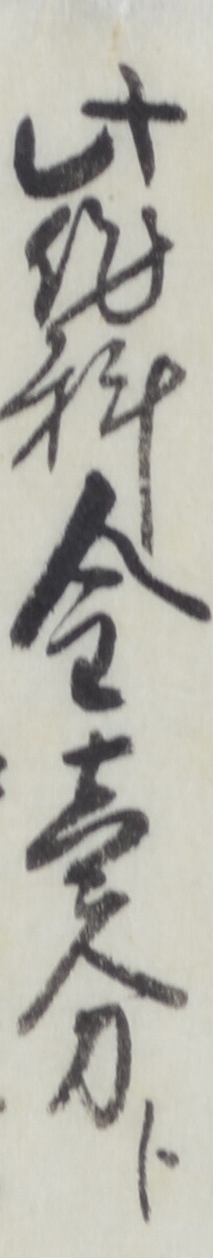此作料金壱分ト
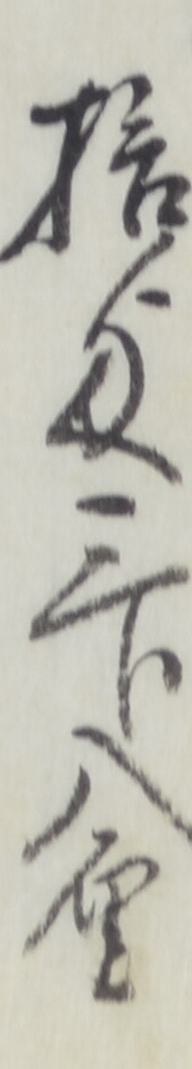拾匁三分八厘
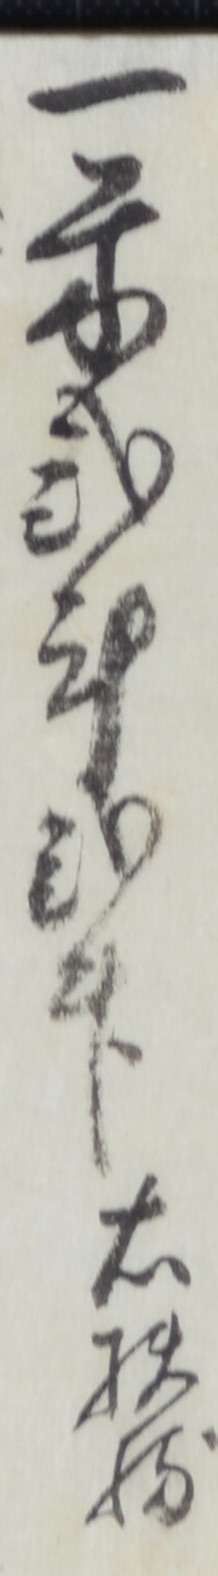一米弐斗弐升右扶持
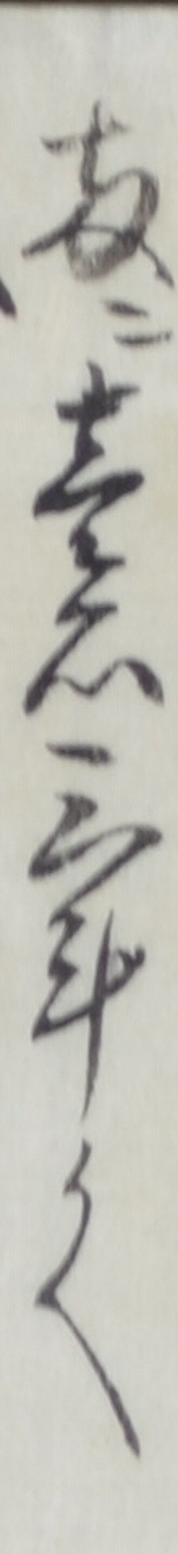両ニ壱石三斗文
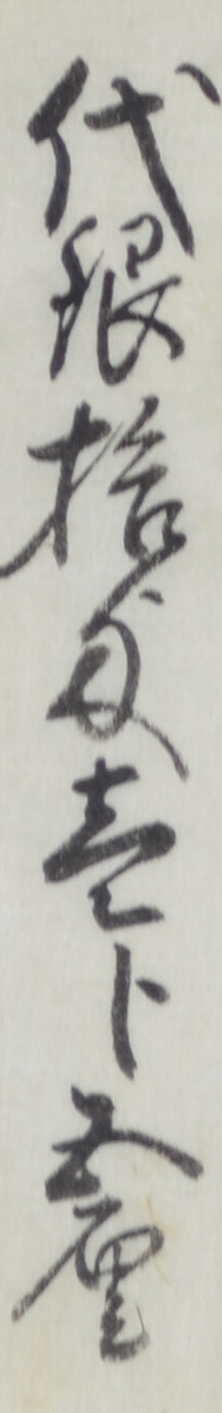代銀拾匁壱分五厘
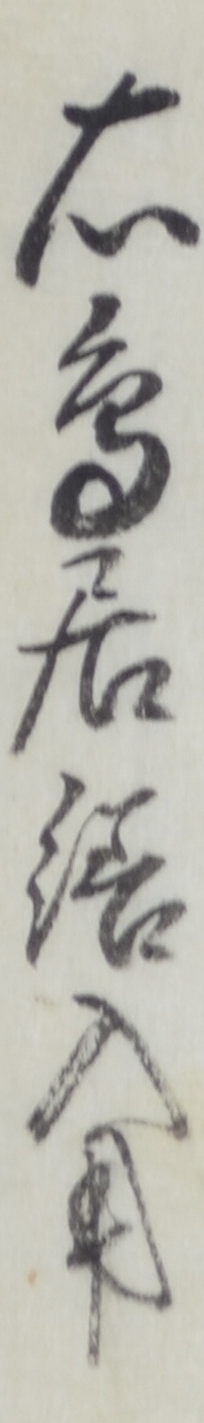右鳥居繕入用
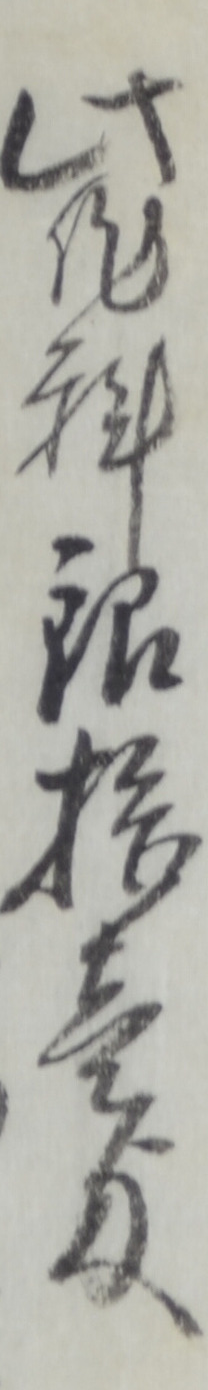此作料銀拾壱匁
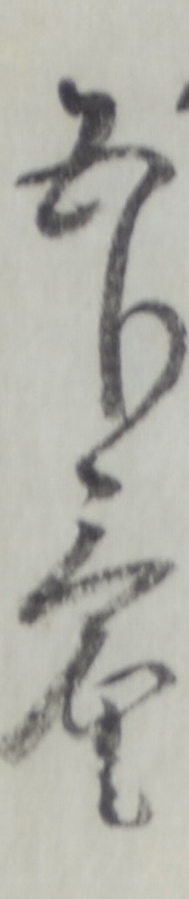五分三厘

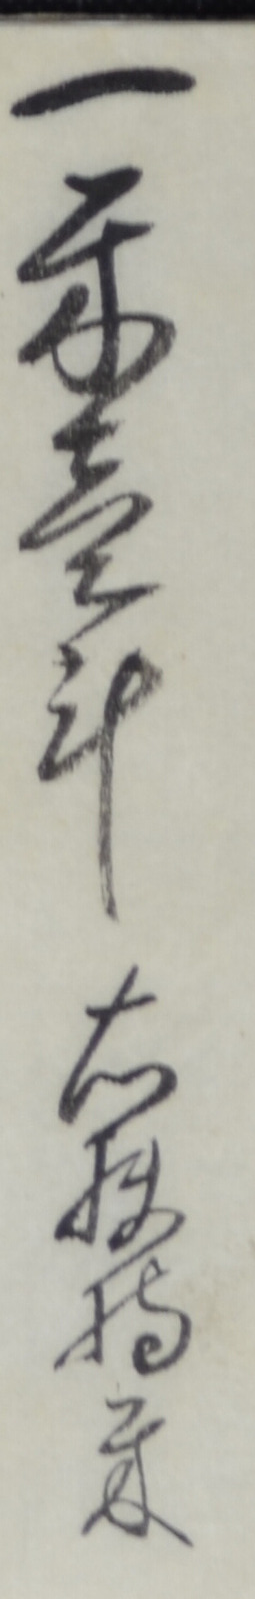一米壱斗右扶持米
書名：権現分拂方
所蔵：伊那市立高遠町図書館・合同会社AMANE
